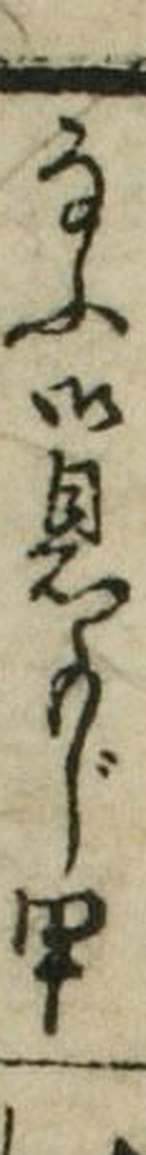なふ御息もじ甲
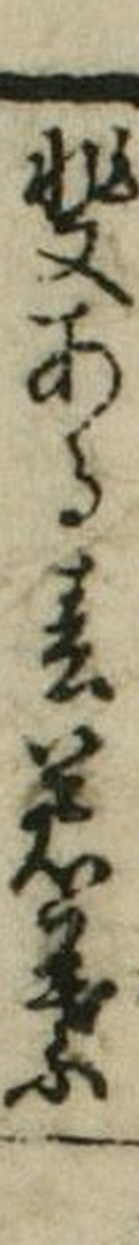斐ある春若葉
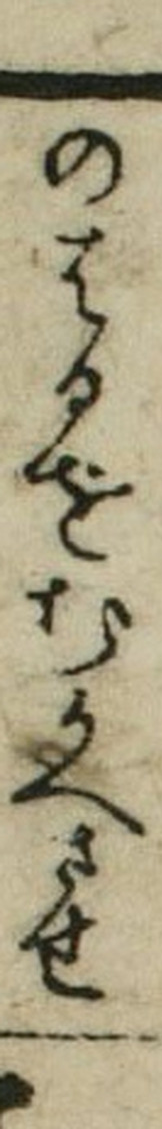のはるをむかへさせ
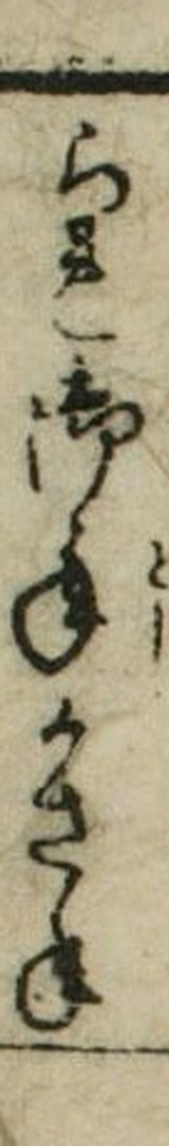られ御年かさね
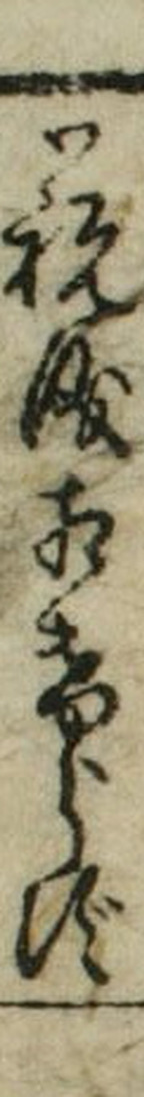御祝儀相替らず
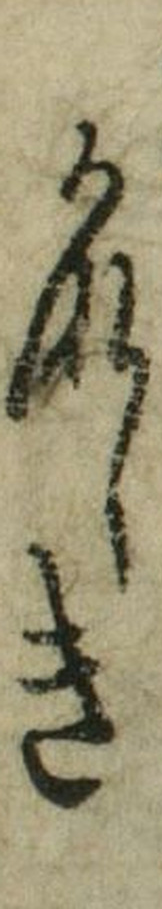かなしき

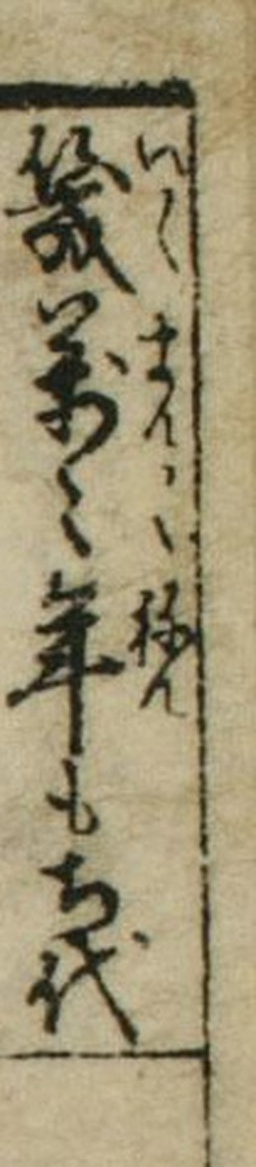幾万々年もち代
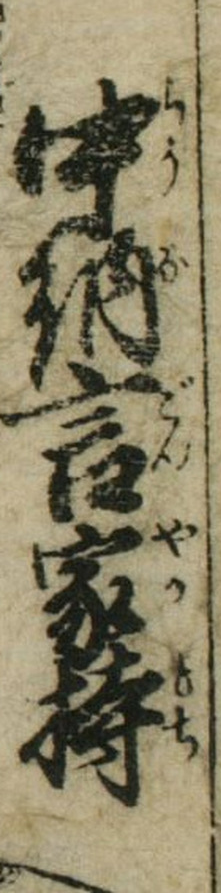中納言家持
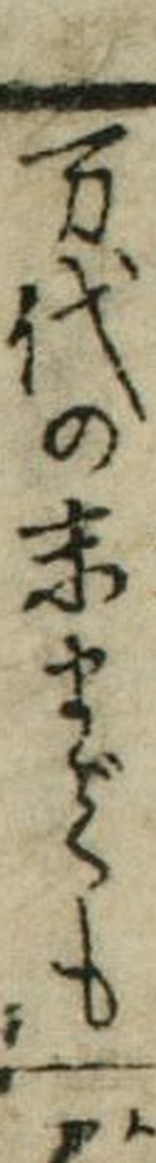万代の末までも
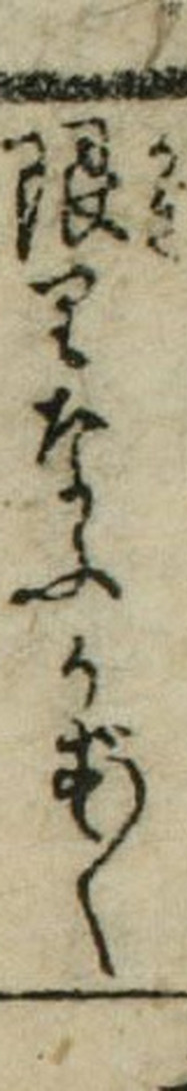限りなふかず〳〵
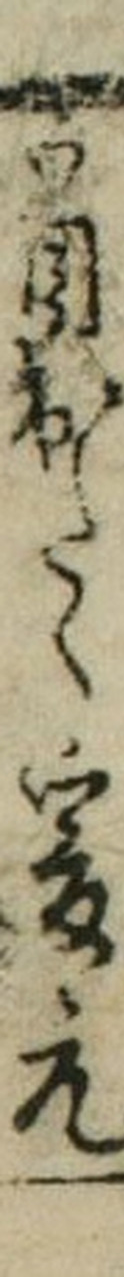御目出たく爰元
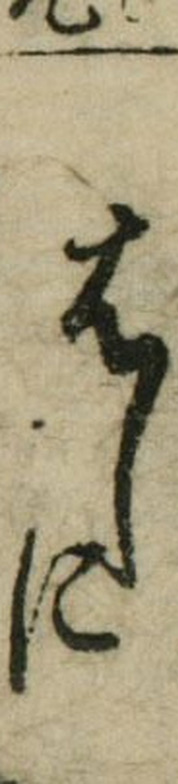はしに
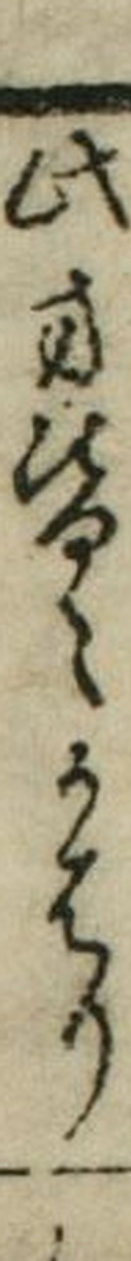此方皆々かはり
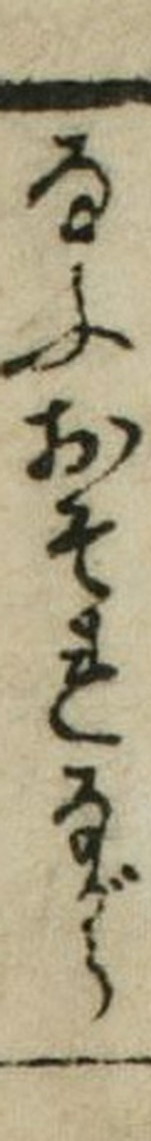なふおそれながら
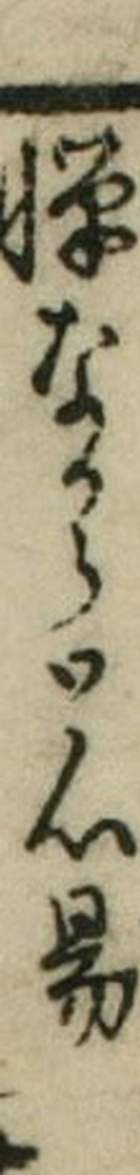憚なから御心易
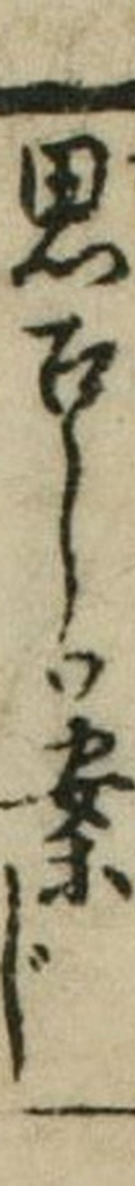思召し御案じ
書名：百人一首
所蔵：東京学芸大学教育コンテンツアーカイブ
